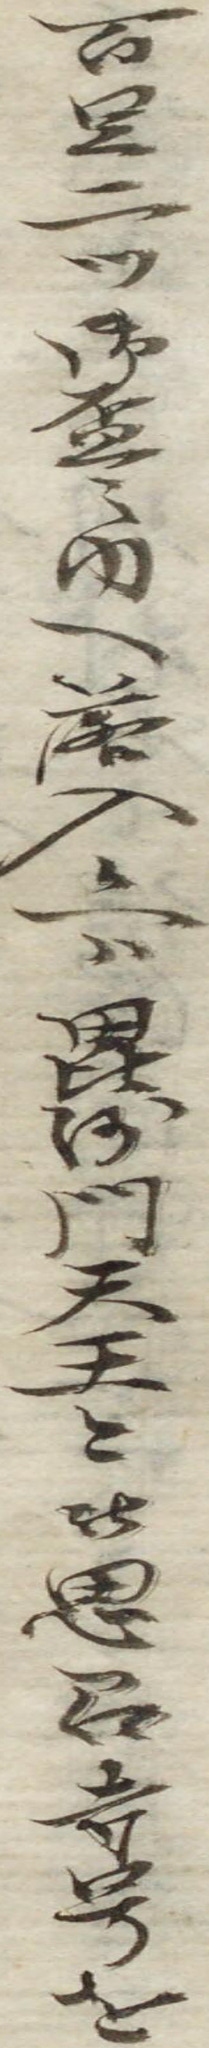百足二ッ御盃之内へ落入候へは毘沙門天と被思召寺号を
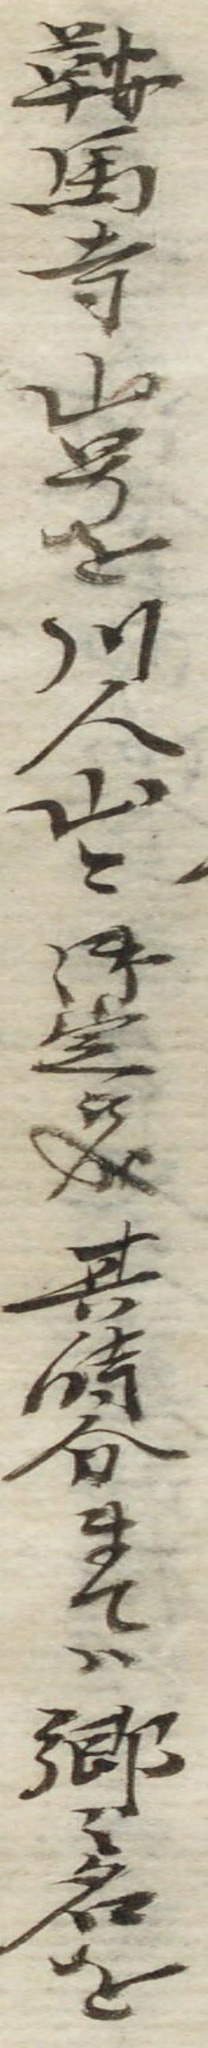鞍馬寺山号を川人山と御定被成其時分まては郷之名を
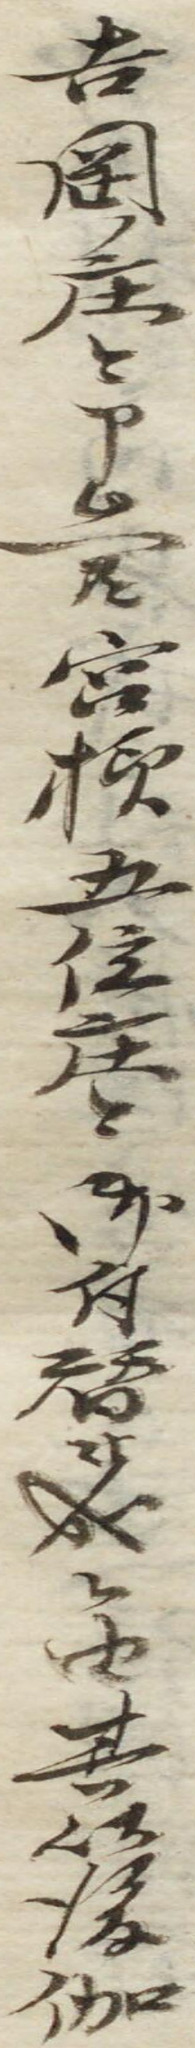吉岡之庄と申候へ共宮様五位庄と御付替被成候由其以後伽
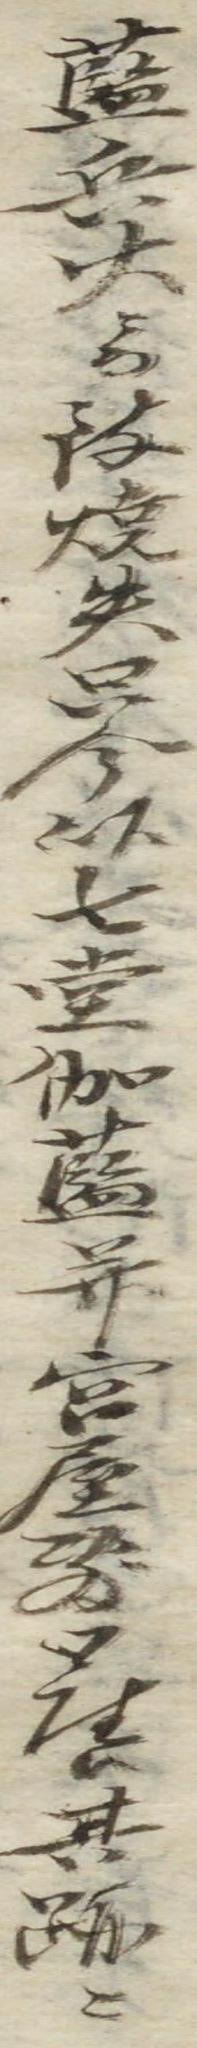藍兵火に而致焼失只今以七堂伽藍并宮屋敷御座候其跡に
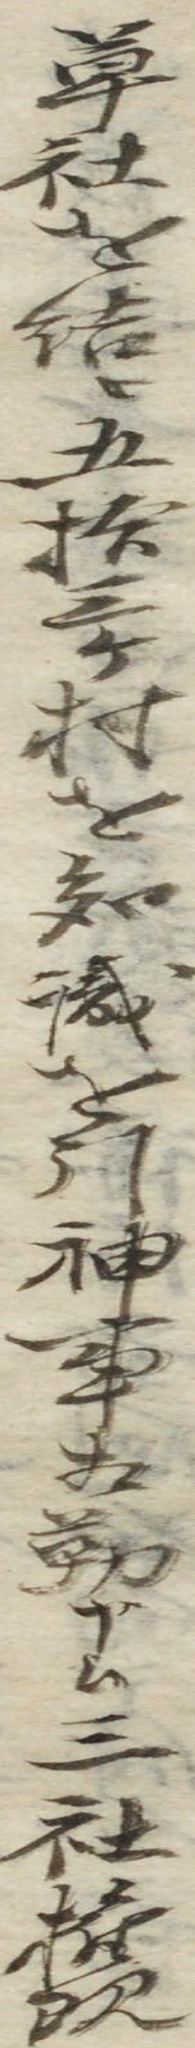草社を結ひ五拾三ヶ村を知識を引神事相勤申候三社権現
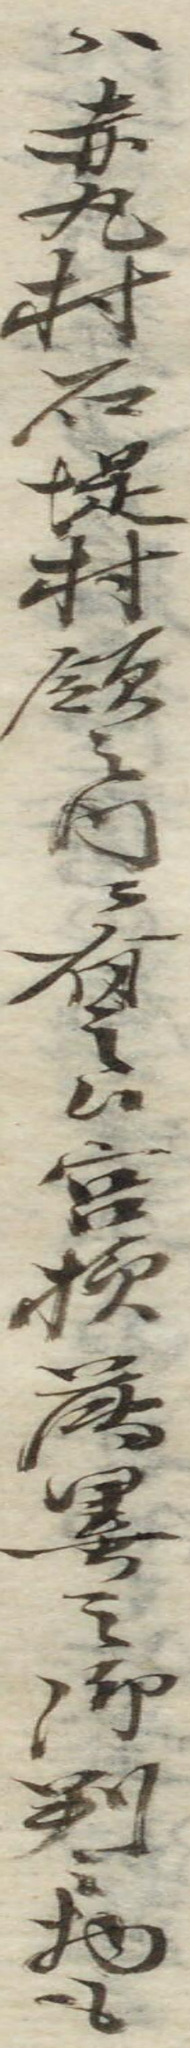は赤丸村石堤村領之内に有之候宮様薄墨之御判之物も
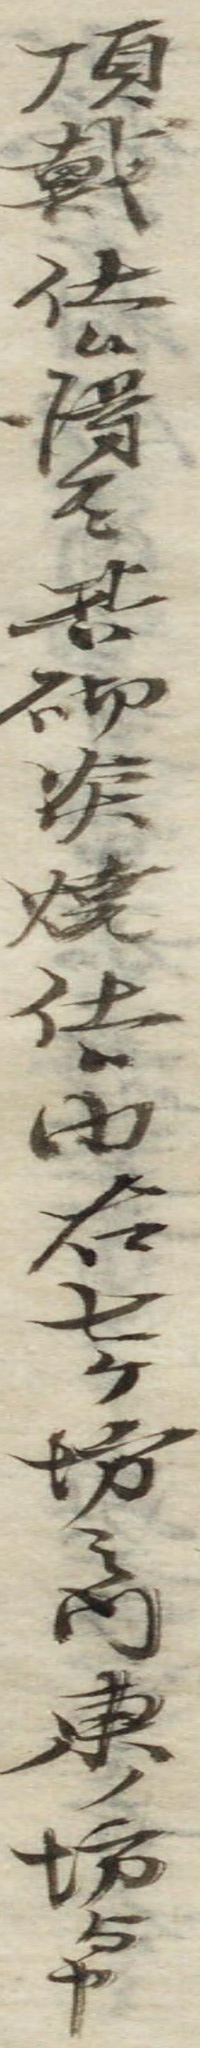頂戴仕候得共其砌炎焼仕候由右七ヶ坊之内東之坊与申
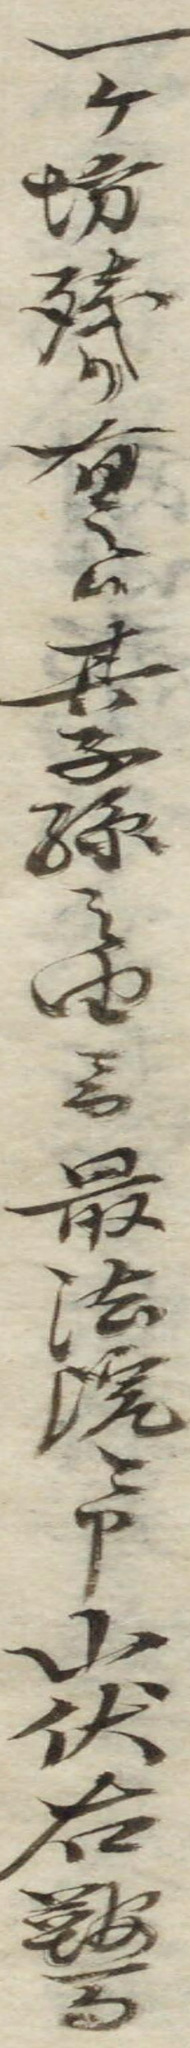一ヶ坊残り有之候其子孫之由に而最法院と申山伏右鞍馬
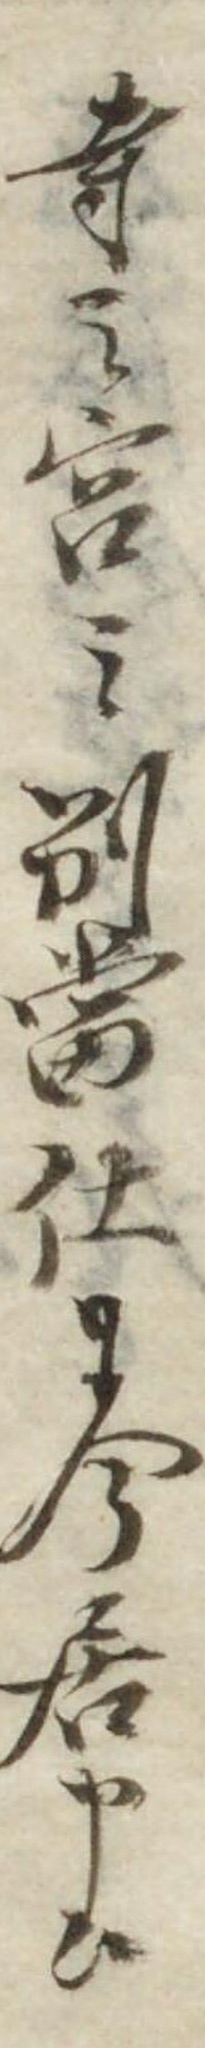寺之宮之別当于今居申候
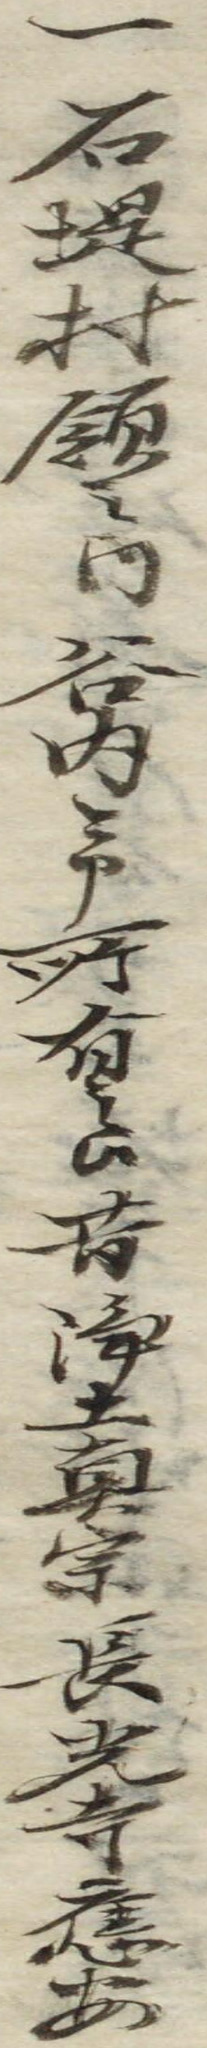一石堤村領之内谷内と申所有之候昔浄土真宗長光寺応安
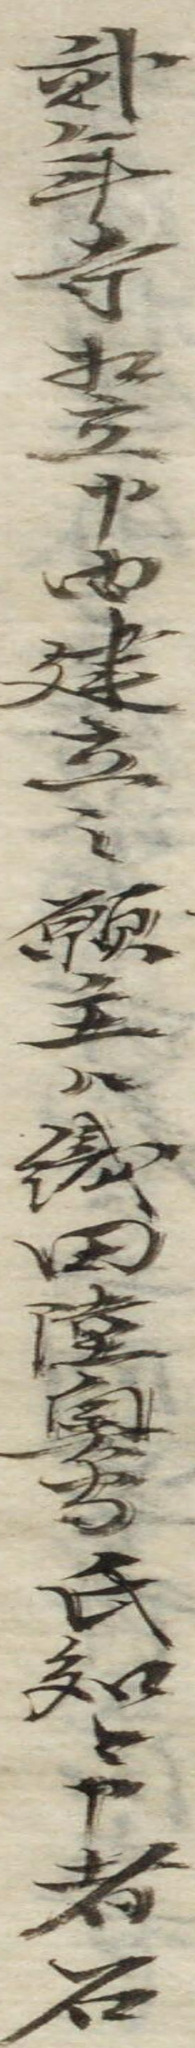弐年寺相立申由建立之願主は織田陸奥守氏知と申者石
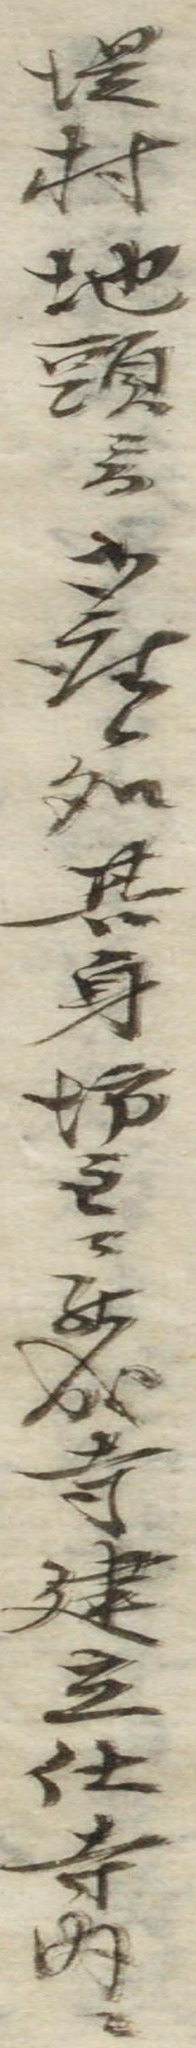堤村地頭に而御座候処其身坊主に罷成寺建立仕寺内に
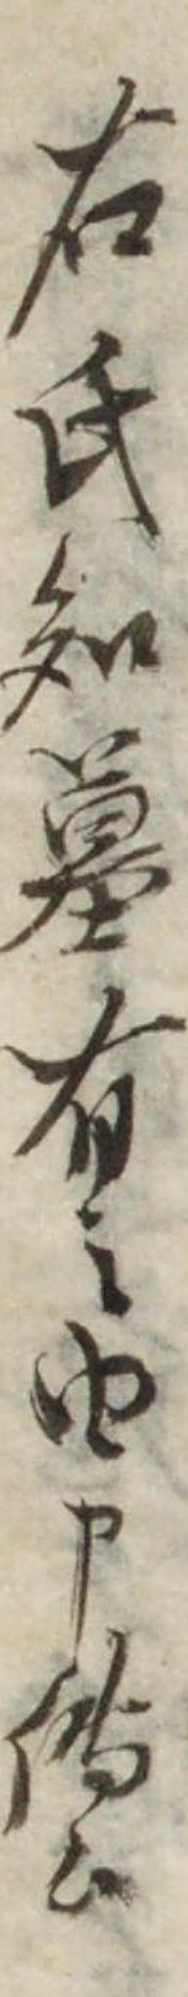右氏知墓有之由申伝候
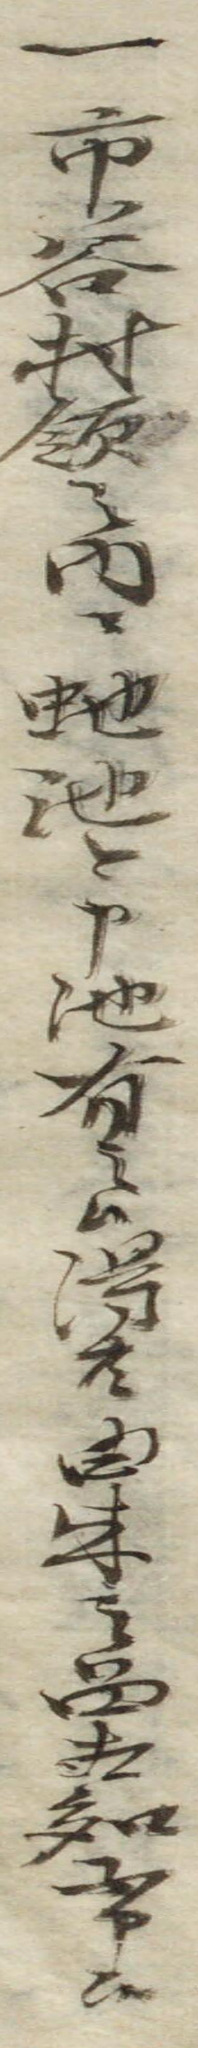一市ノ谷村領ノ内に蛇池と申池有之候得共由来之品相知不申候
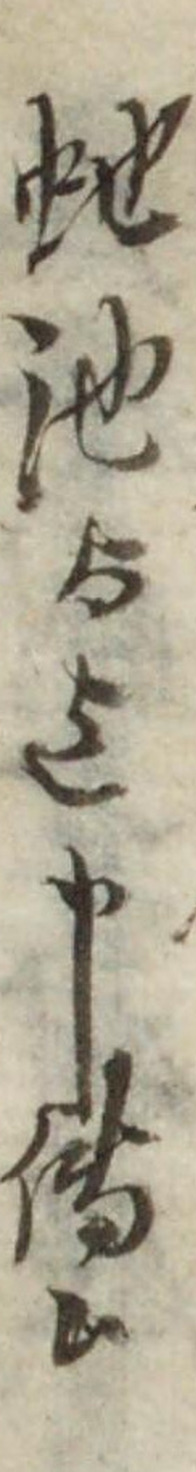蛇池与迄申伝候
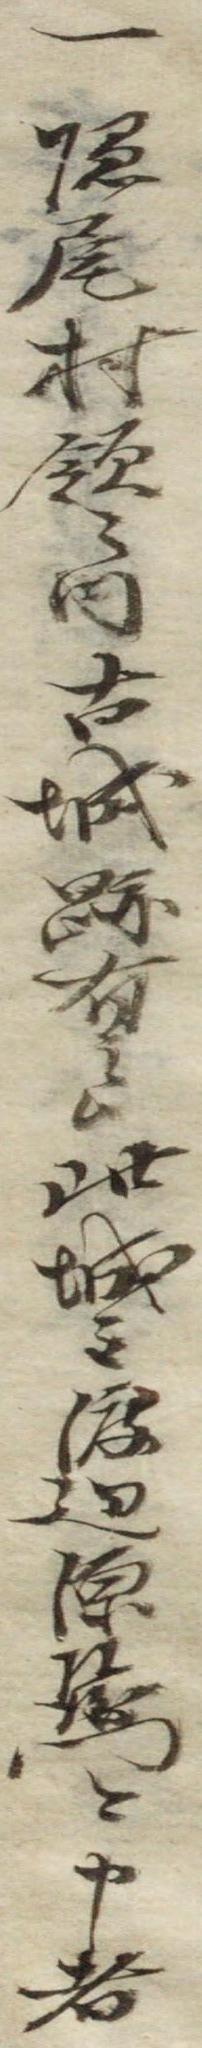一隠尾村領之内古城跡有之候此城主渡辺源左衛門と申者
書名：加越能旧聞録
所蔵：Ishikawa Prefectural Library
